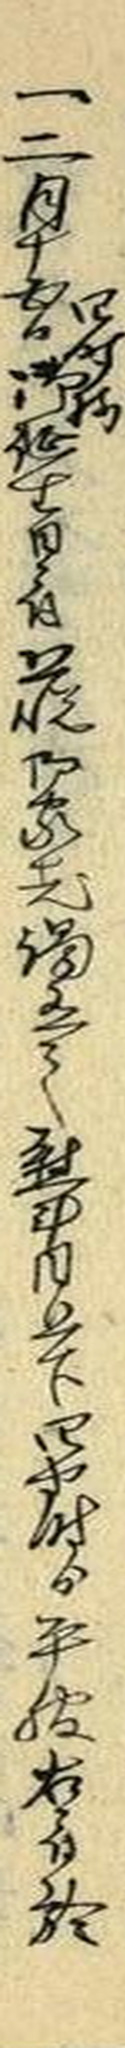一二月十五日四時揃御誕生日ニ付恐悦御家老謁有之熨斗目上下四半時ゟ平服右ニ付於
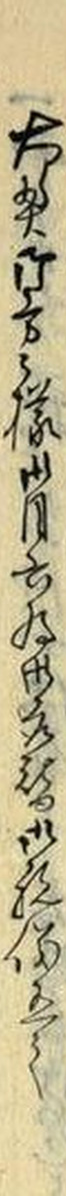大奥御方々様御目六為御取替御祝儀有之
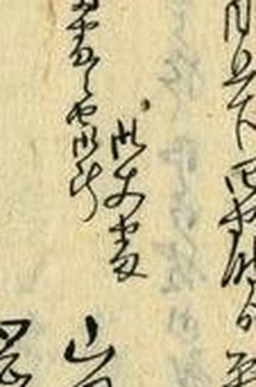御使番
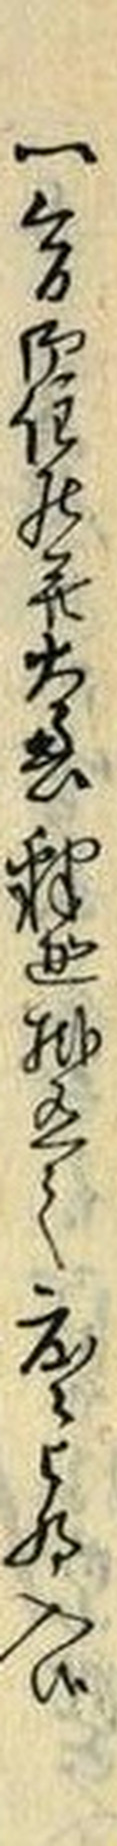一今日御住居并大奥釈迦掛有之度々被為入候
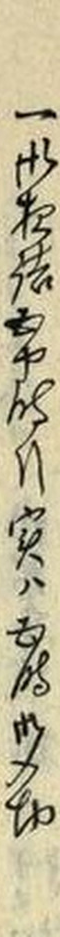一御夜詰五半時引実ハ五時御〆切
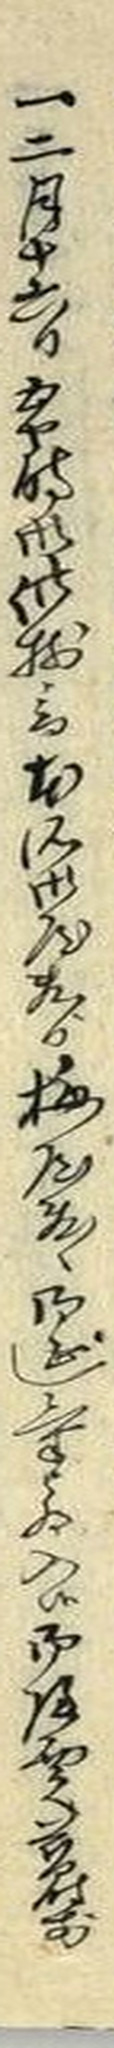一二月十六日五半時御供揃ニ而本所御屋敷ゟ梅屋敷へ御延気被為入候御帰殿暮時前
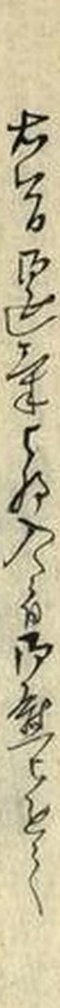右今日御延気被為入候ニ付御慰被進之
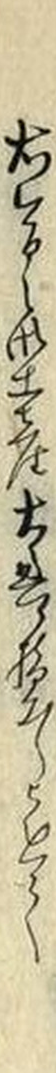右今日之御土産大奥へ差出之被進之
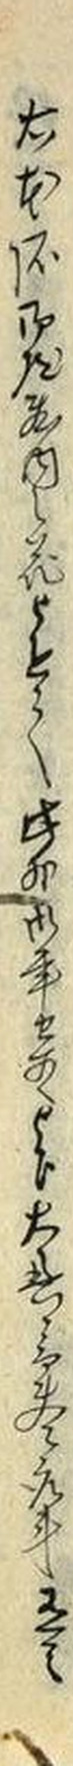右本所御屋敷内之花被進之此外御年寄へ被下大奥ニ而夫々取斗有候
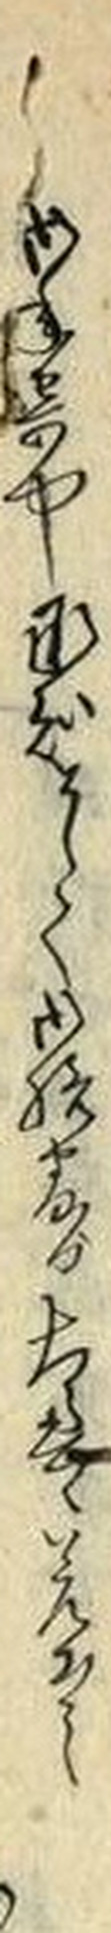御年寄中承知とて御膳番ゟ大奥へ差出之

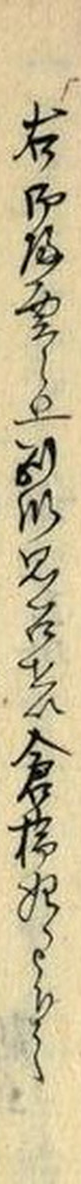右御帰殿之上別段思召を以倉橋始へ被下之
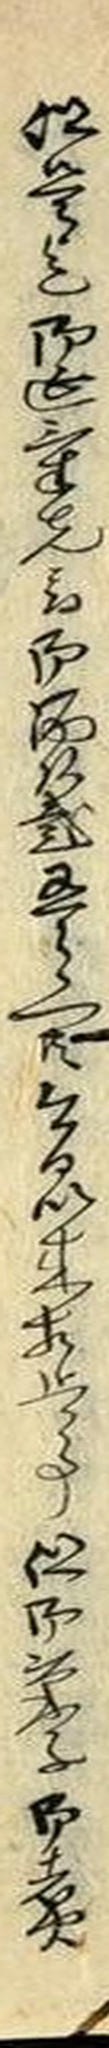但是迄御延気先ニ而御酒頂戴有之候へ共今日以来相止候事但御菓子御煮
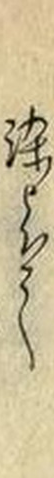染被下之
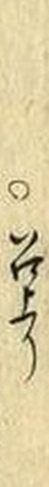〇召上り
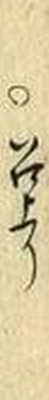〇召上り
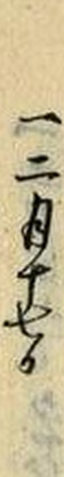一二月十七日
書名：少傅日録抄（斉承付側向頭取日記、在府）
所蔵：福井県文書館 Fukui Prefectural Archives
